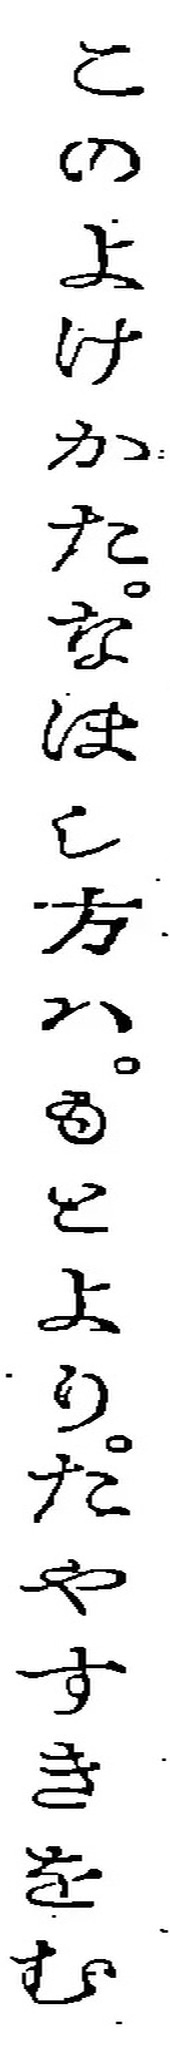このよけかた。なほし方は。もとより。たやすきをむ
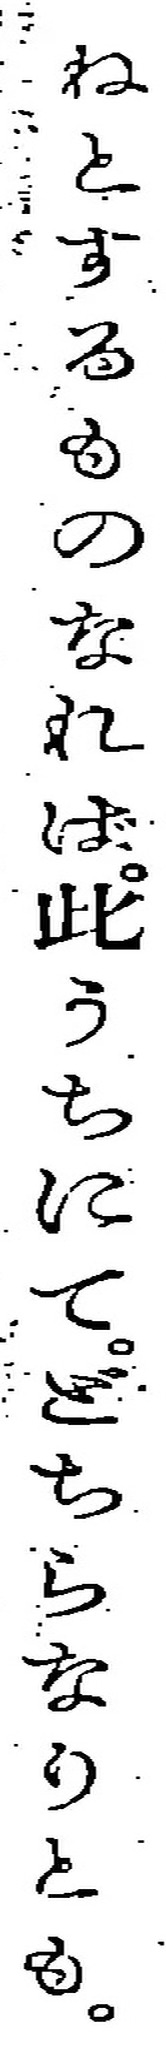ねとするものなれは。此うちにて。とちらなりとも。
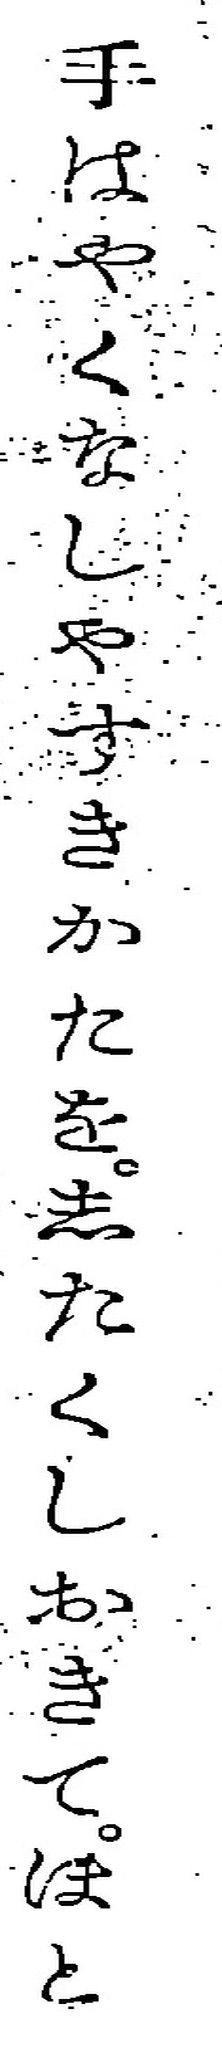手はやくなしやすきかたを。志たくしおきて。ほと
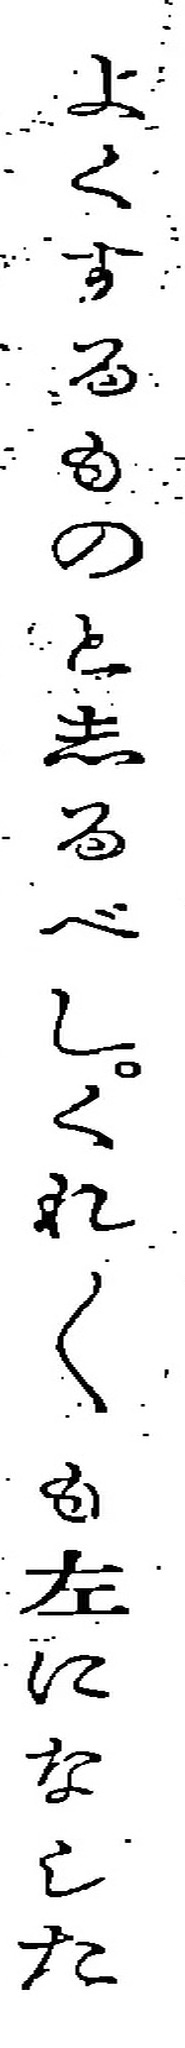よくするものと志るべし。くれ〳〵も左になした
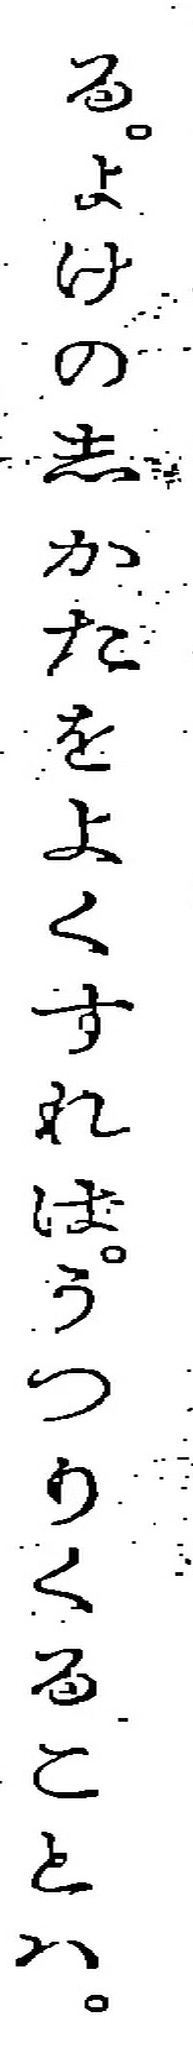る。よけの志かたをよくすれは。うつりくることは。
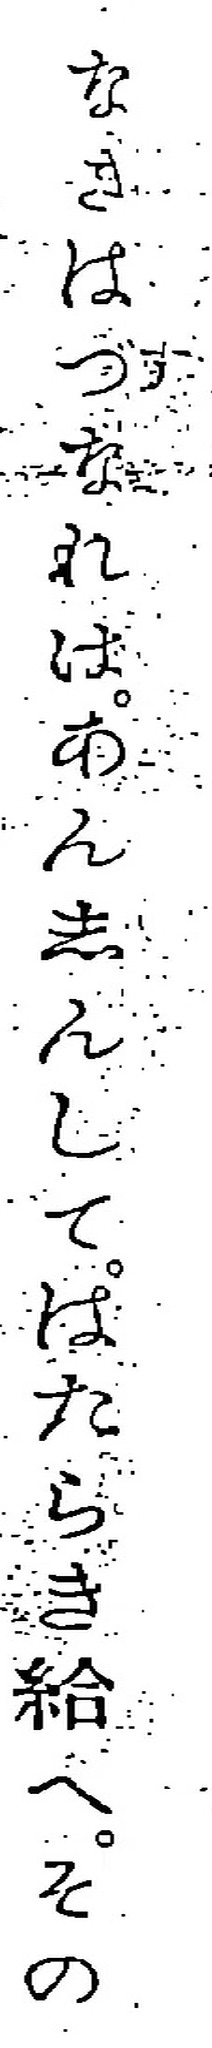なきはづなれは。あん志んして。はたらき給へ。その
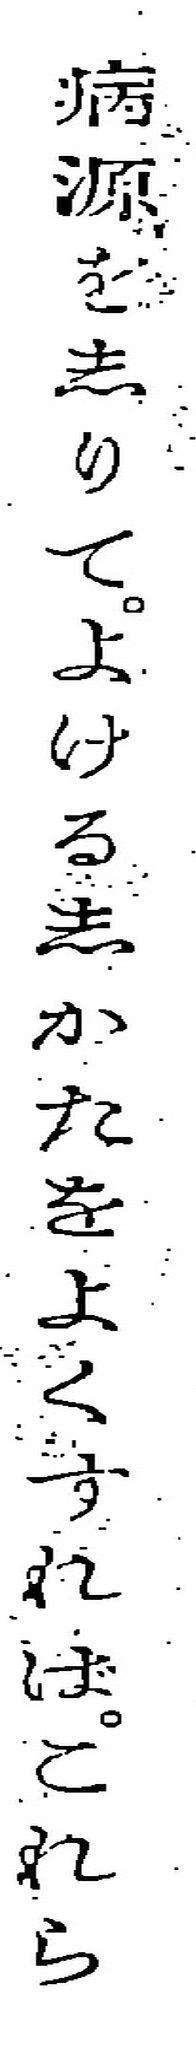病源を志りて。よける志かたをよくすれは。これら
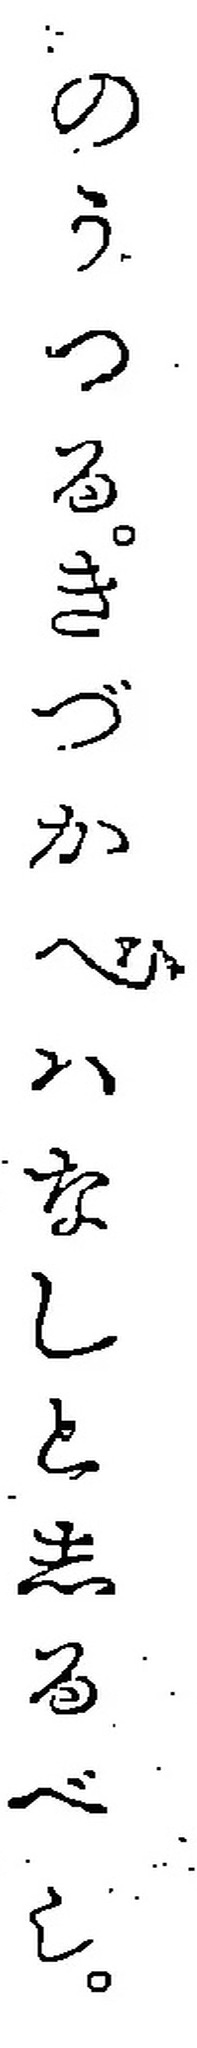のうつる。きづかへはなしと志るべし。
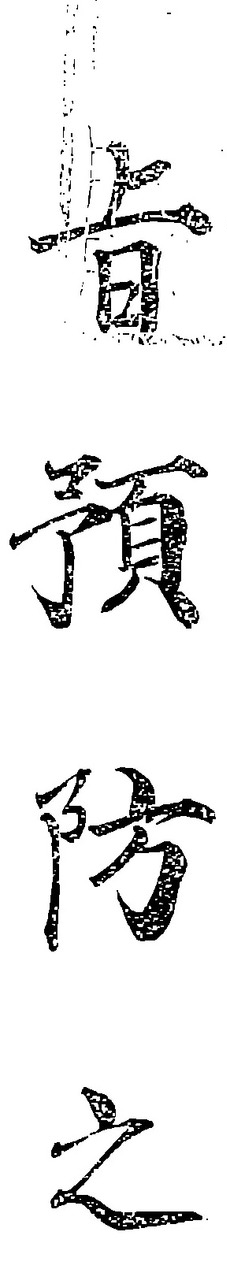旨預防之
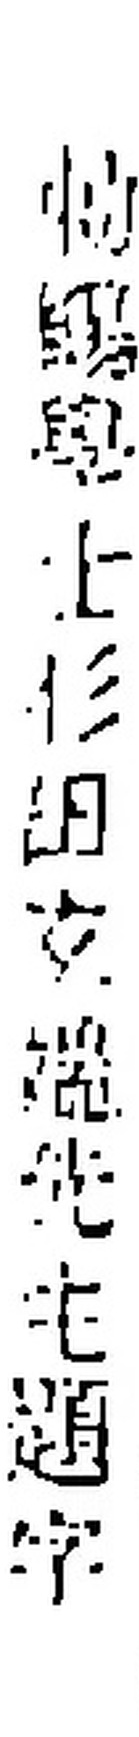勅賜学士杉田玄端先生題字

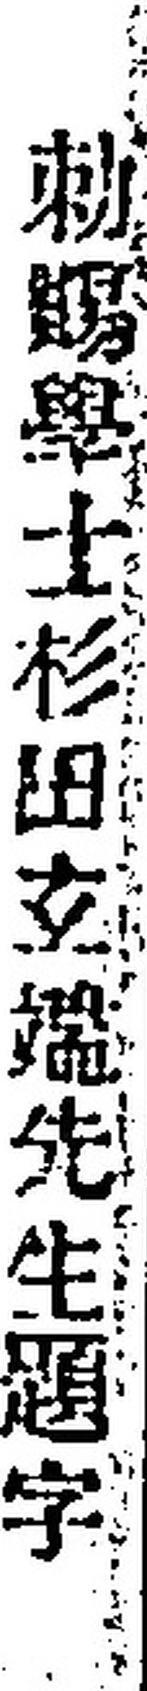勅賜学士杉田玄端先生題字

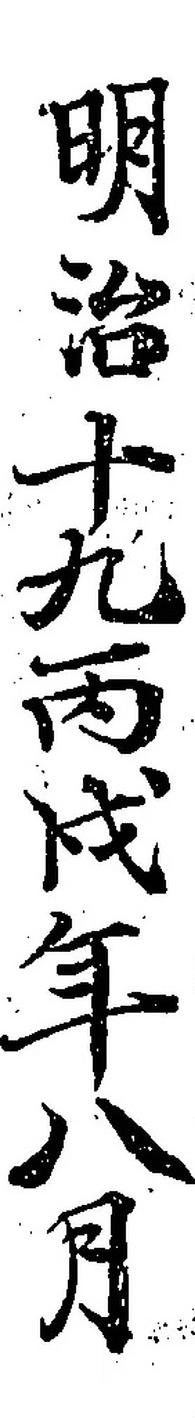明治十九丙戌年八月
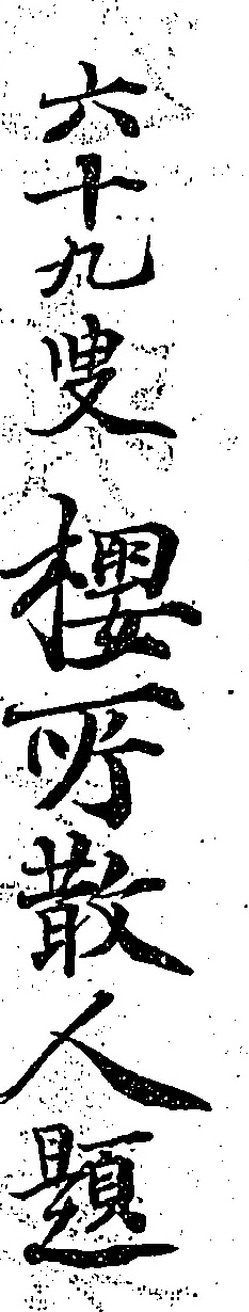六十九叟桜所散人題

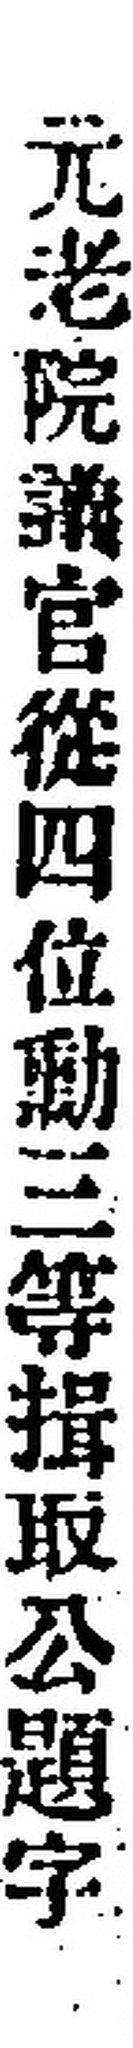元老院議官従四位勲三等揖取公題字

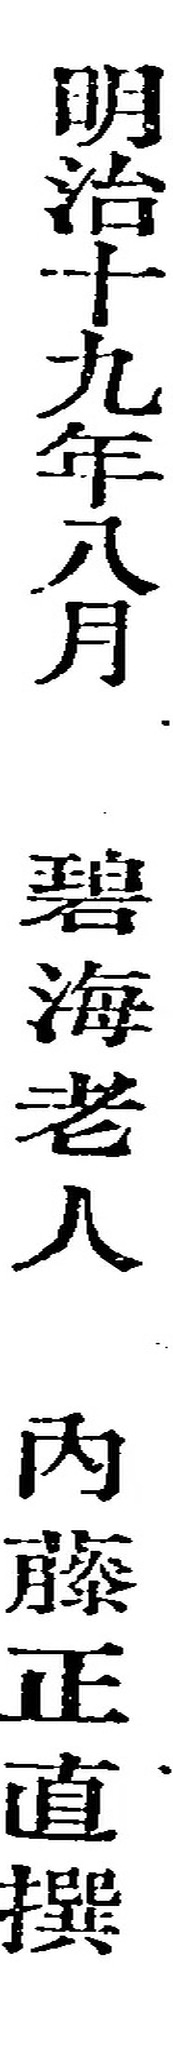明治十九年八月碧海老人内藤正直撰

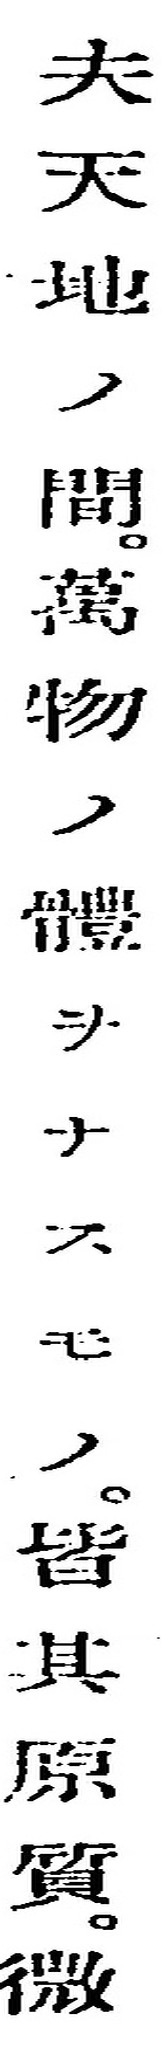夫天地の間。万物の體をなすもの。皆其原質。微
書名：駆疫法 : コレラヲヨケ並ニナホスシカタ
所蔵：国立国会図書館 National Diet Library, JAPAN
